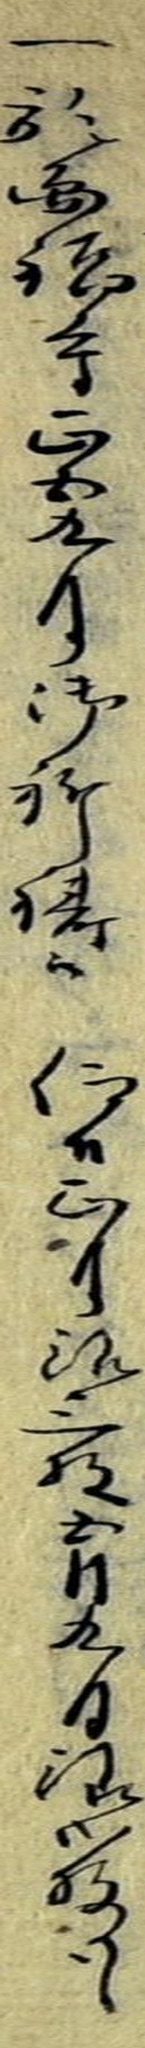一於円福寺正五九月御祈祷被仰付正月銀三枚五月九月銀弐枚つヽ
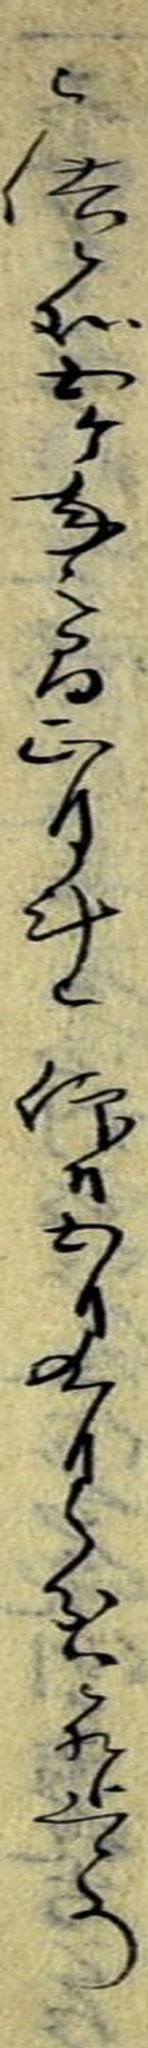被供候処五ヶ年之間正月斗被仰付五月九月之分は被相止候事

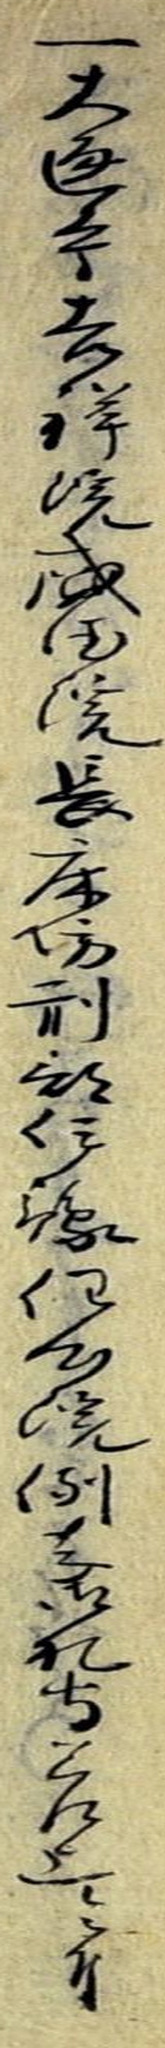一大通寺吉祥院成徳院長床坊刑部伊予住心院例年御札守差上候に付
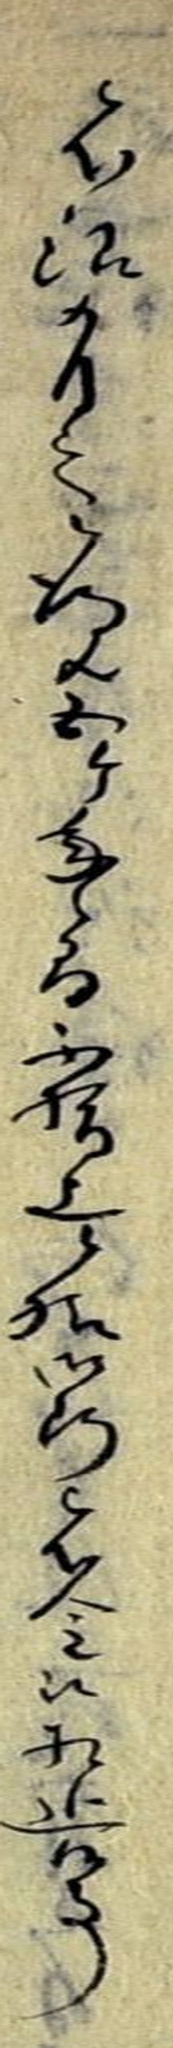被下銀有之候得共五ヶ年之間不指上候様御断被下金被相止候事
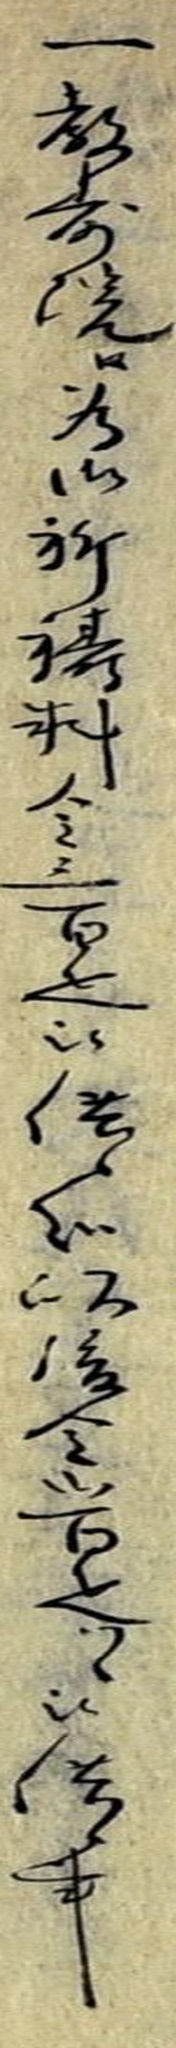一教寿院江為御祈祷料金三百疋被供候処以後金弐百疋つヽ被供候事
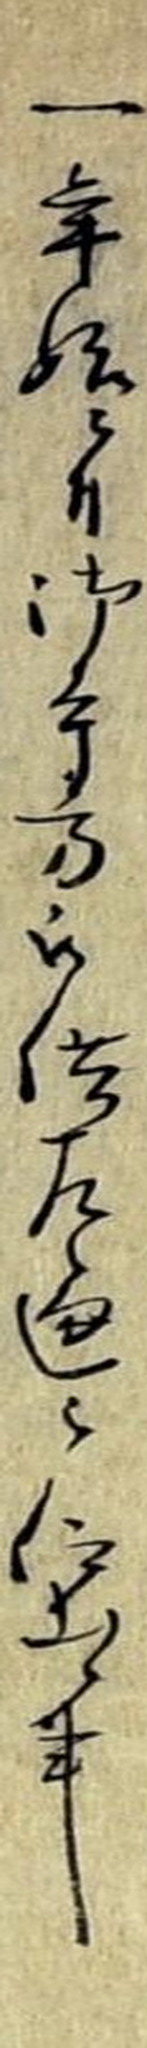一年始に付御寺方被供左之通被仰出候事
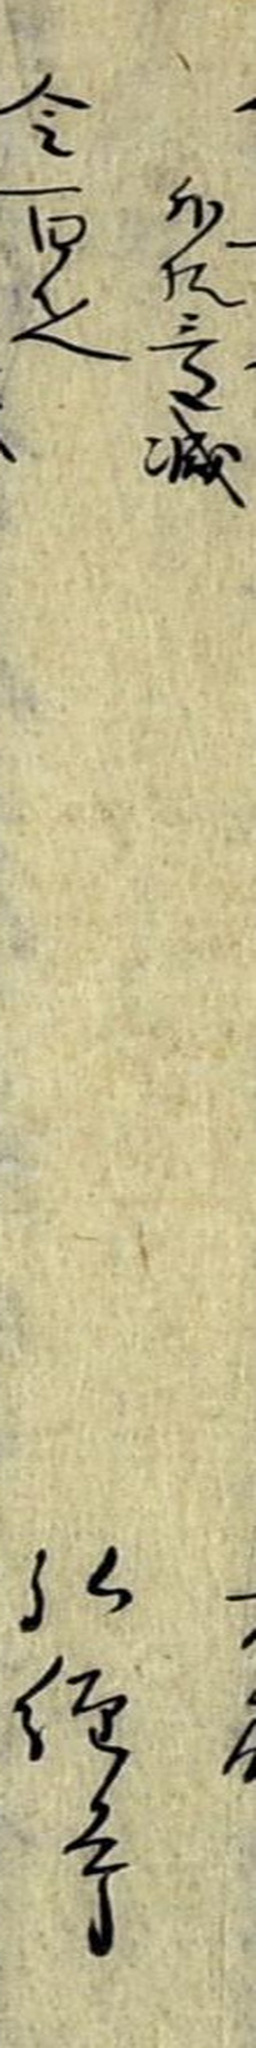金百疋同寺
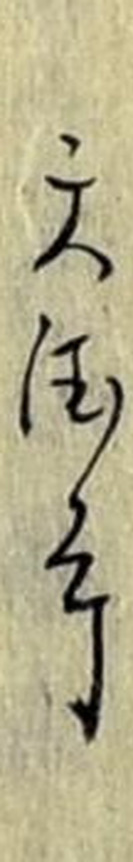天龍寺
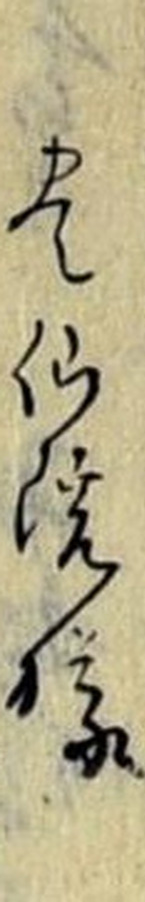豊仙院様
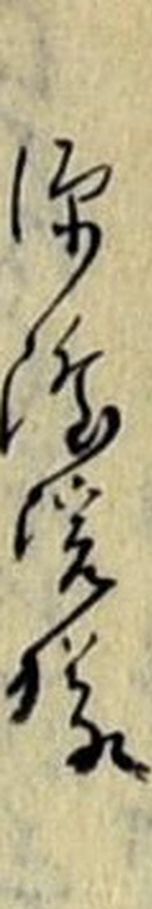源隆院様
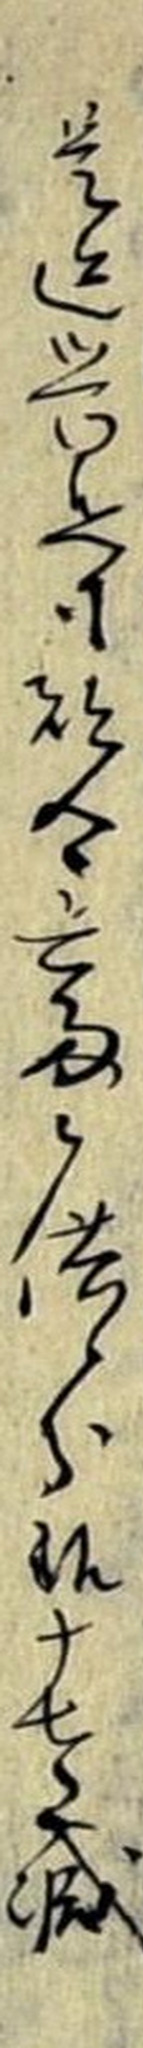是迄弐百疋つヽ都合壱両被供候分銀十七匁減
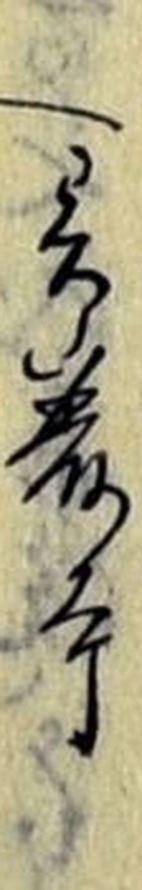霊厳寺
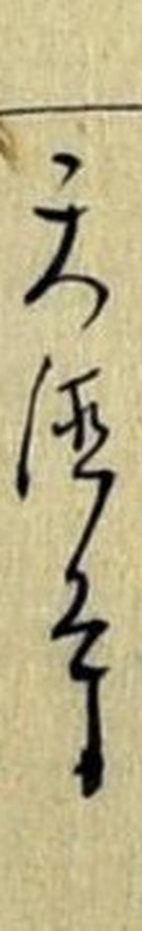天龍寺
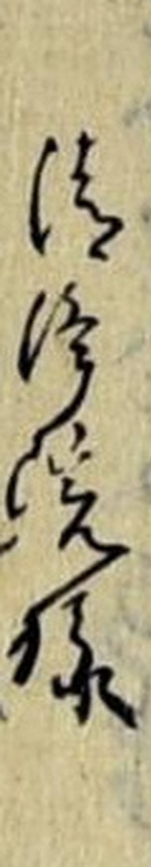清浄院様
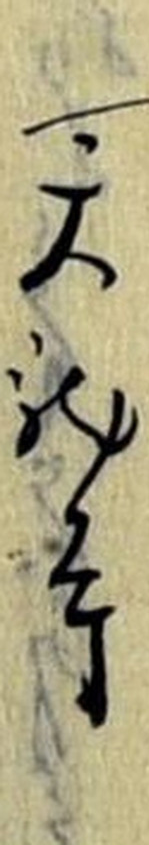天龍寺
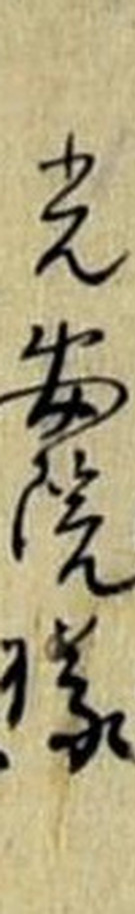光安院様
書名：命令之部 四
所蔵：福井県文書館 Fukui Prefectural Archives
